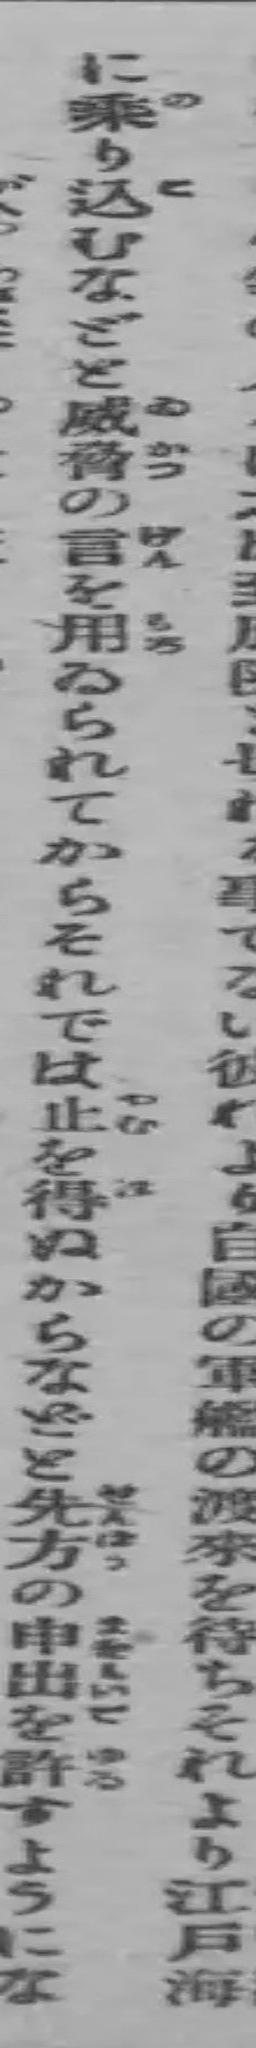に乗り込むなどと威脅の言を用ゐられてからそれでは止を得ぬからなどと先方の申出を許すようにな
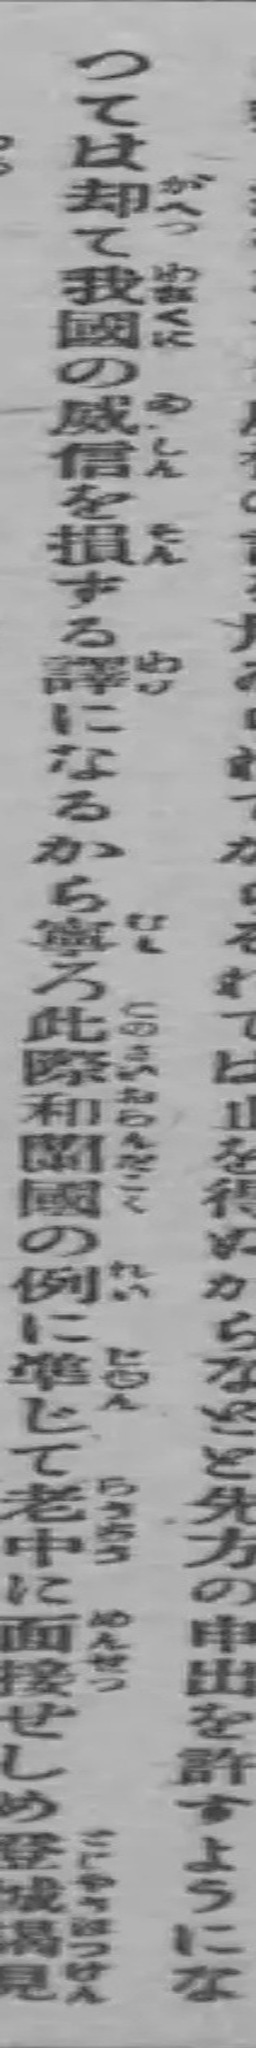つては却て我国の威信を損ずる訳になるから寧ろ此際和蘭国の例に準じて老中に面接せしめ登城謁見
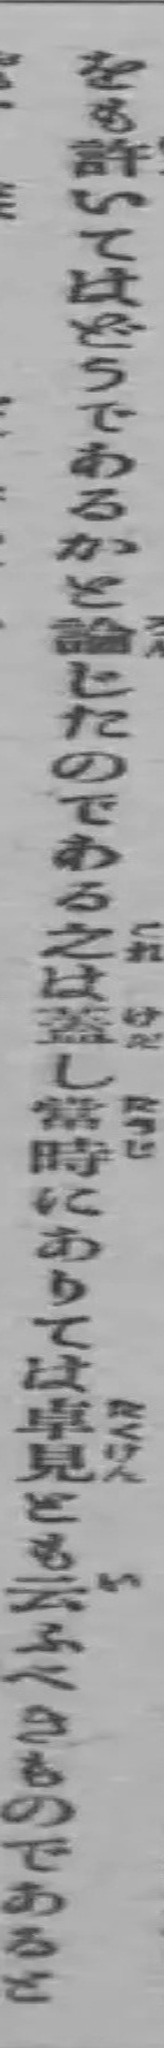をも許いてはどうであるかと論じたのである之は蓋し当時にありては卓見とも云ふべきものであると
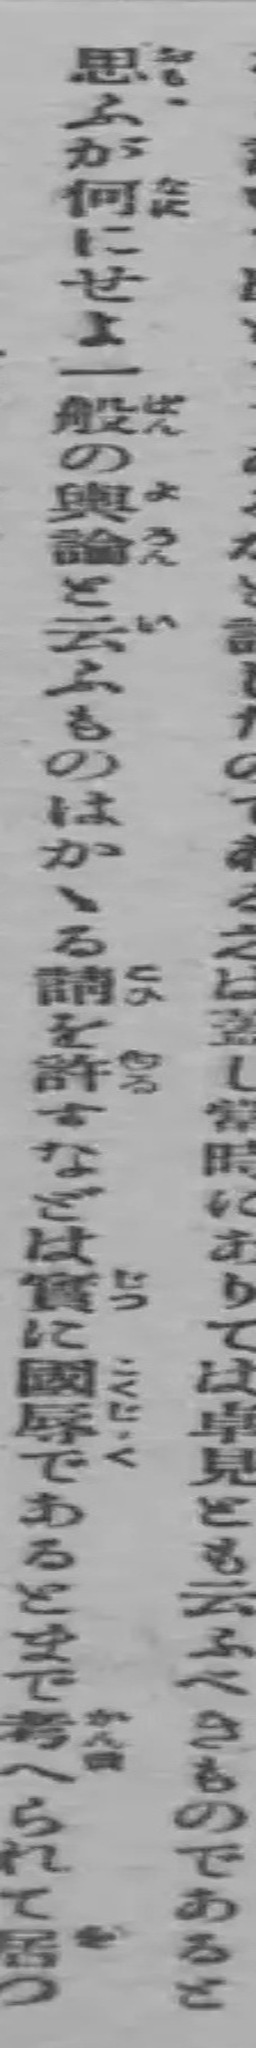思ふが何にせよ一般の輿論と云ふものはかゝる請を許すなどは実に国辱であるとまで考へられて居つ
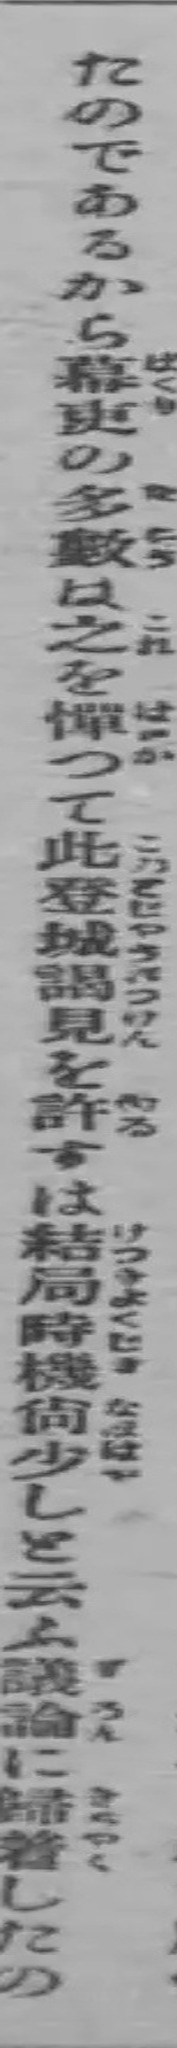たのであるから幕吏の多数は之を憚つて此登城謁見を許すは結局時機尚少しと云ふ議論に帰着したの
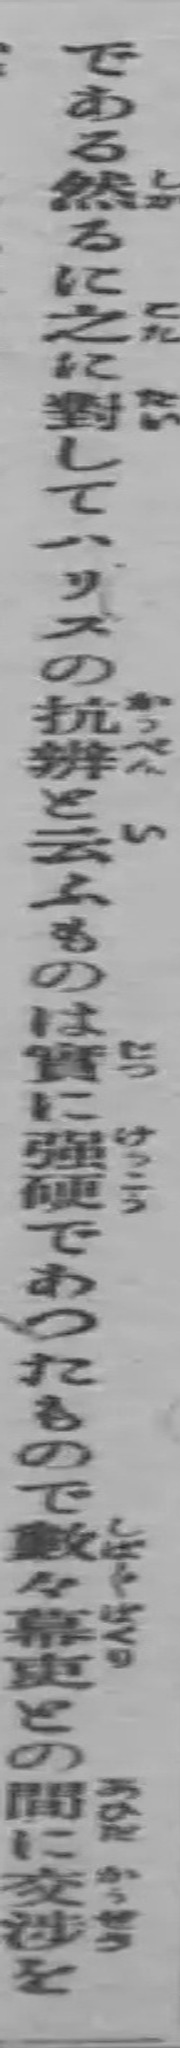である然るに之に対してハリスの抗弁と云ふものは実に強硬であつたもので数々幕吏との間に交渉を
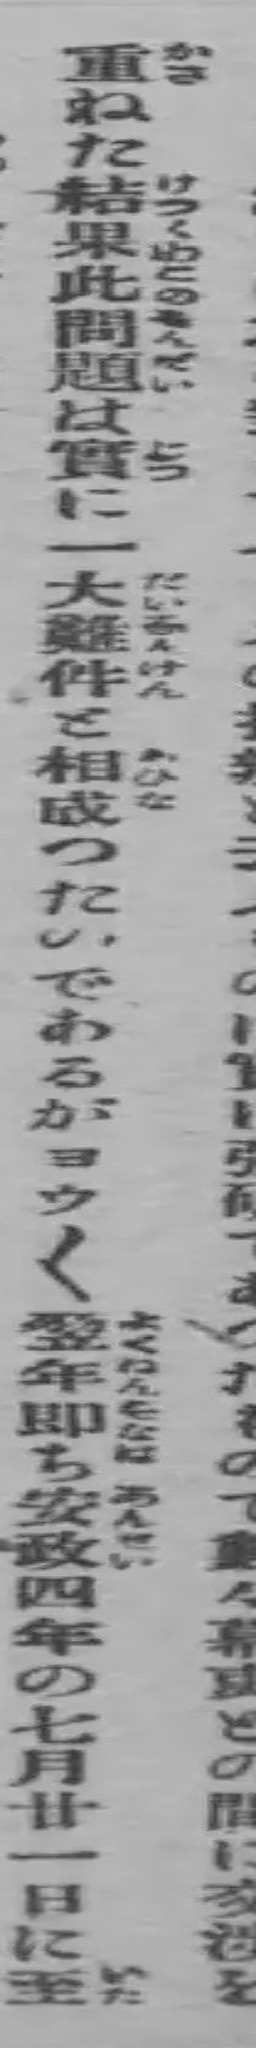重ねた結果此問題は実に一大難件と相成つたのであるがヨウ〳〵翌年即ち安政四年の七月廿一日に至
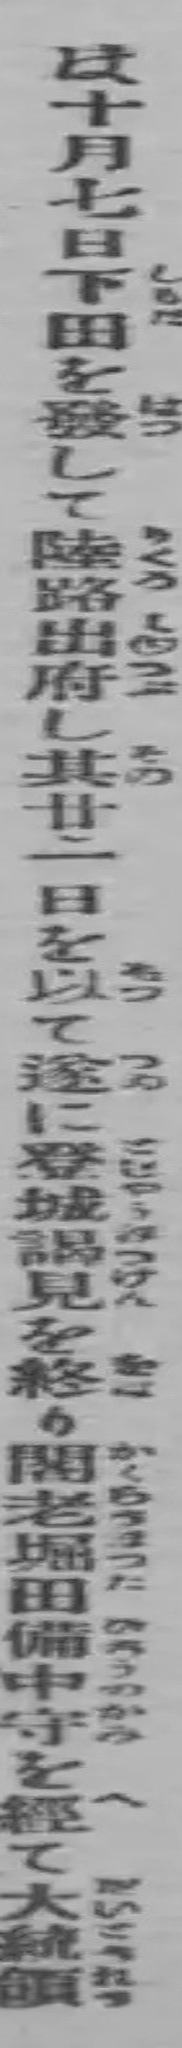は十月七日下田を発して陸路出府し其廿一日を以て遂に登城謁見を終り閣老堀田備中守を経て大統領
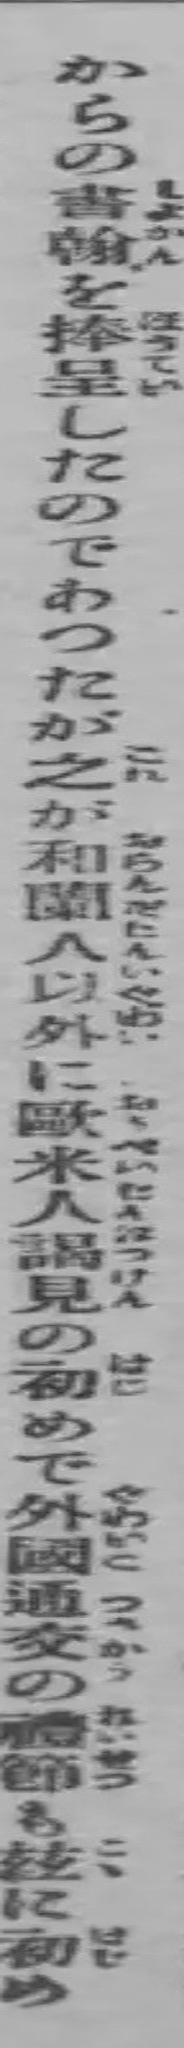からの書翰を捧呈したのであつたが之が和蘭人以外に欧米人謁見の初めで外国通交の礼節も茲に初め
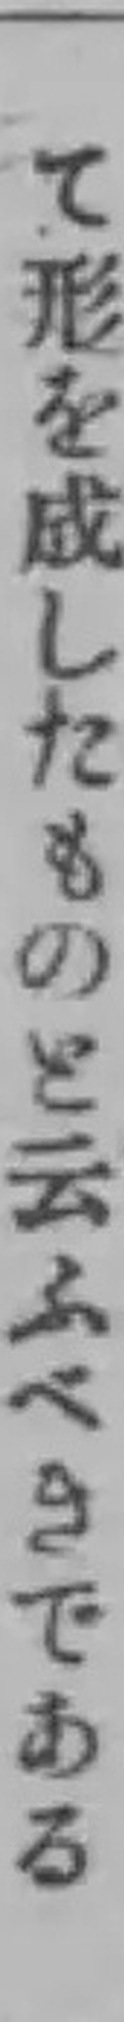て形を成したものと云ふべきである
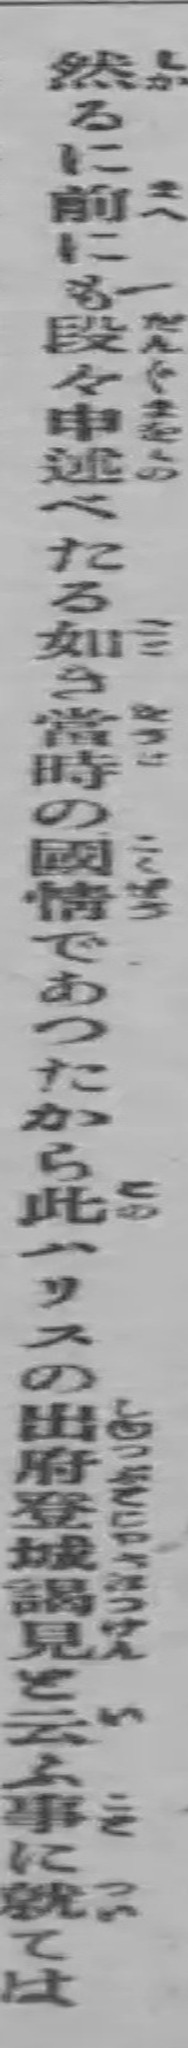列侯の異論然るに前にも段々申述べたる如き当時の国情であつたから此ハリスの出府登城謁見と云ふ事に就ては
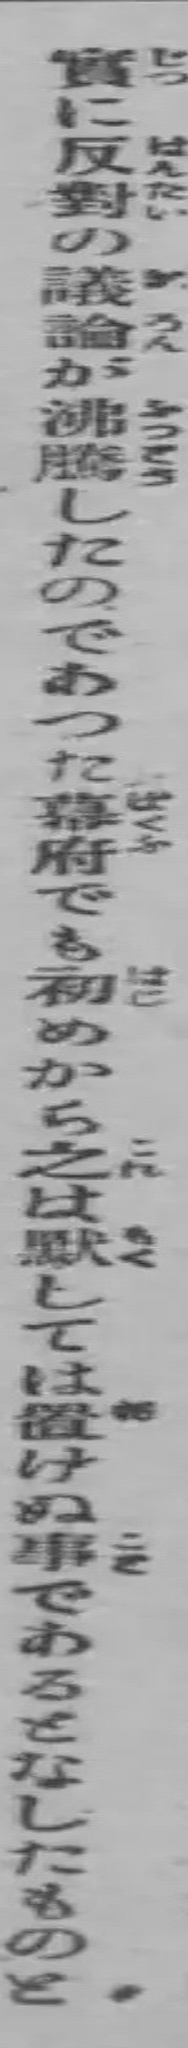実に反対の議論が沸騰したのであつた幕府でも初めから之は黙しては置けぬ事であるとなしたものと
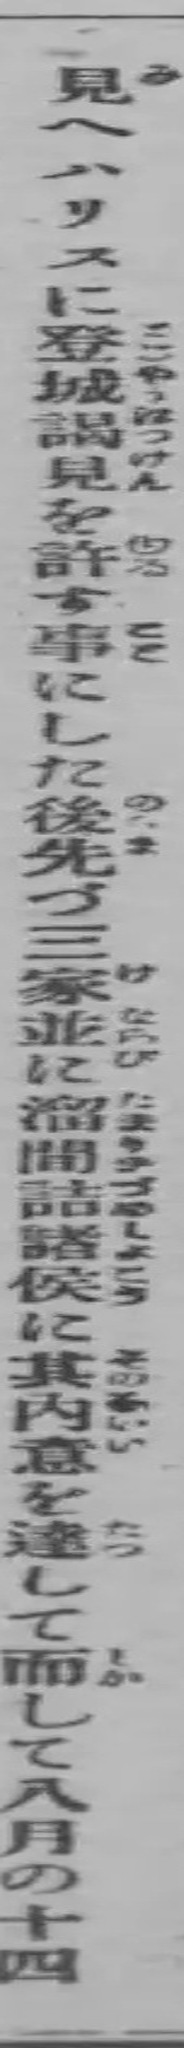見へハリスに登城謁見を許す事にした後先づ三家並に溜間詰諸侯に其内意を達して而して八月の十四
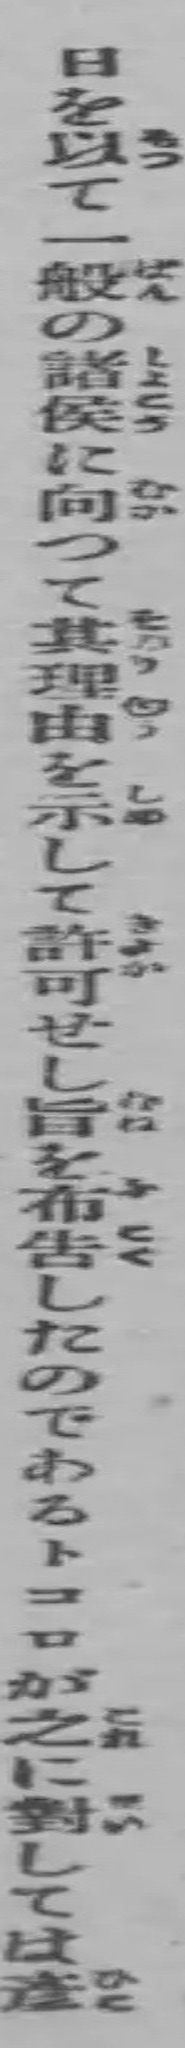日を以て一般の諸侯に向つて其理由を示して許可せし旨を布告したのであるトコロが之に対しては彦
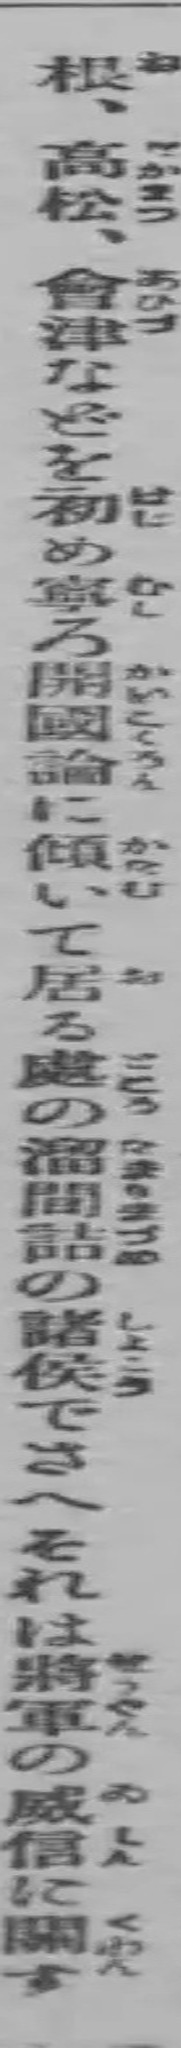根、高松、会津などを初め寧ろ開国論に傾いて居る処の溜間詰の諸侯でさへそれは将軍の威信に関す
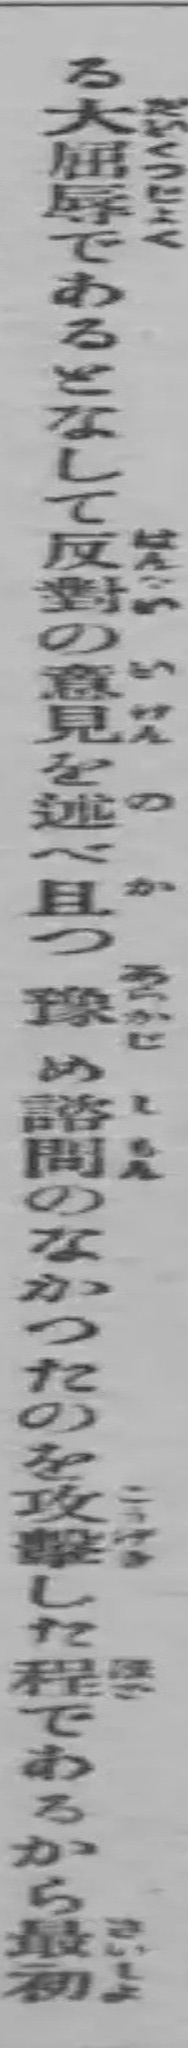る大屈辱であるとなして反対の意見を述べ且つ予め諮問のなかつたのを攻撃した程であるから最初
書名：豊橋市史談
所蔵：国立国会図書館 National Diet Library, JAPAN
